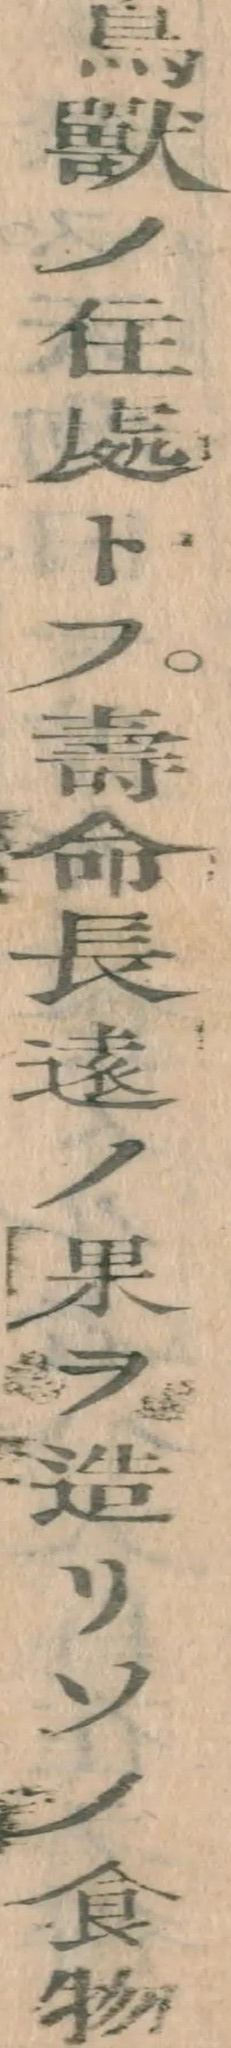鳥獣ノ住処トフ。寿命長遠ノ果ヲ造リソノ食物
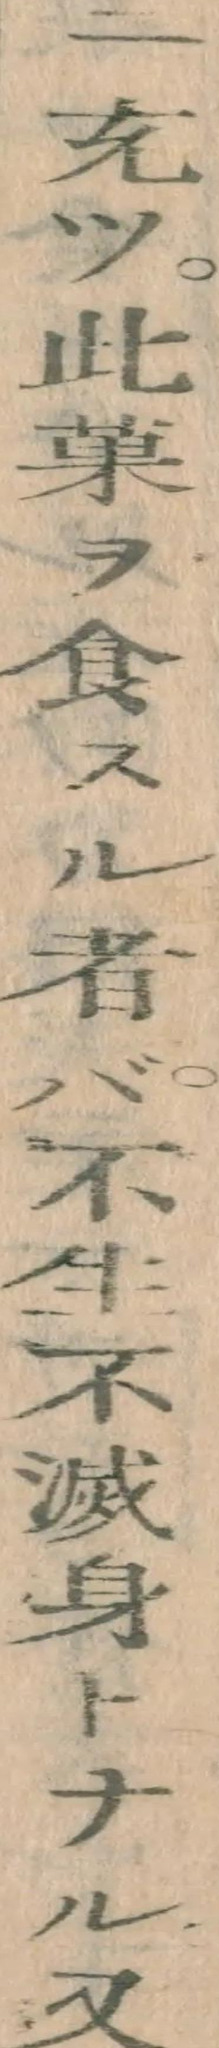ニ充ツ。此菓ヲ食スル者バ。不生不滅身トナル又
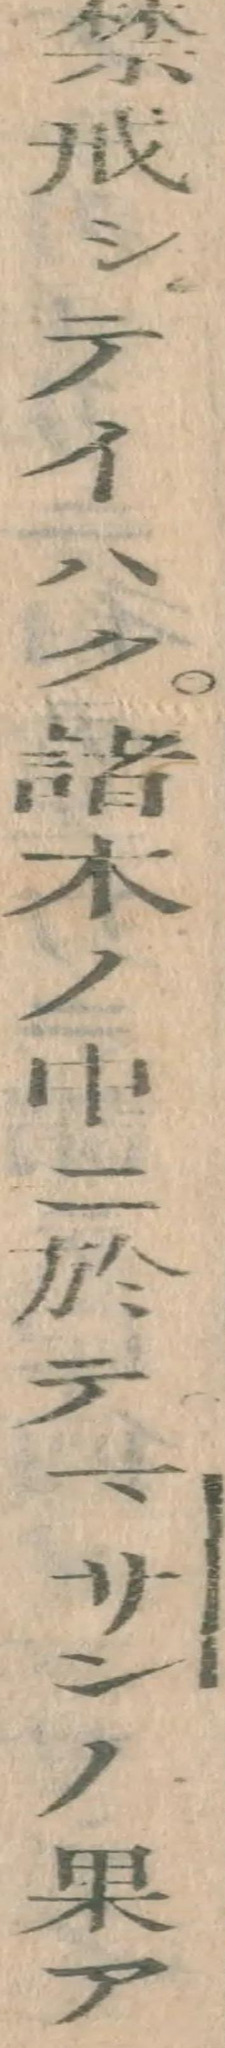禁戒シテイハク。諸木ノ中ニ於テマサンノ果ア
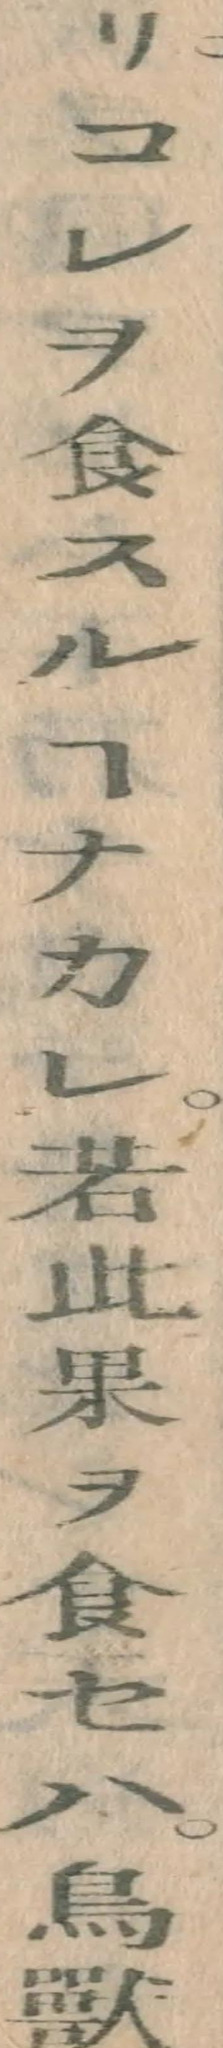リ。コレヲ食スルヿナカレ。若此果ヲ食セハ。鳥獣
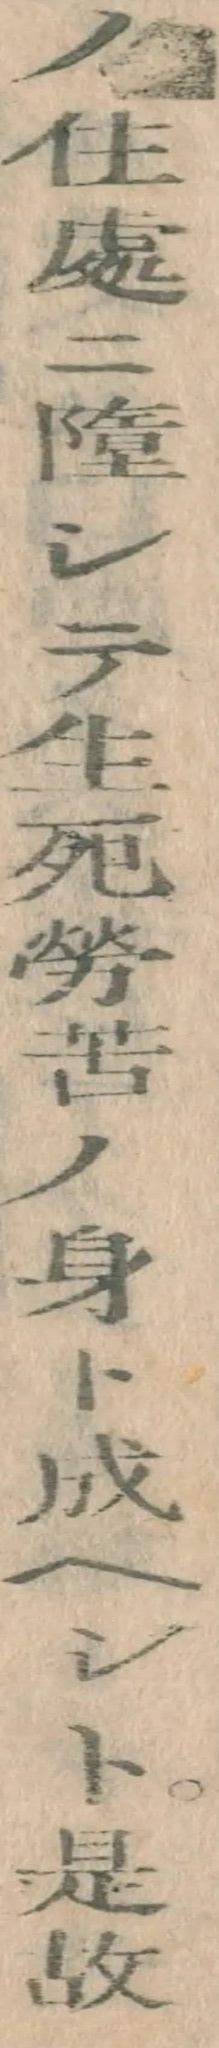ノ住処ニ堕シテ生死労苦ノ身ト成ヘシト。是故
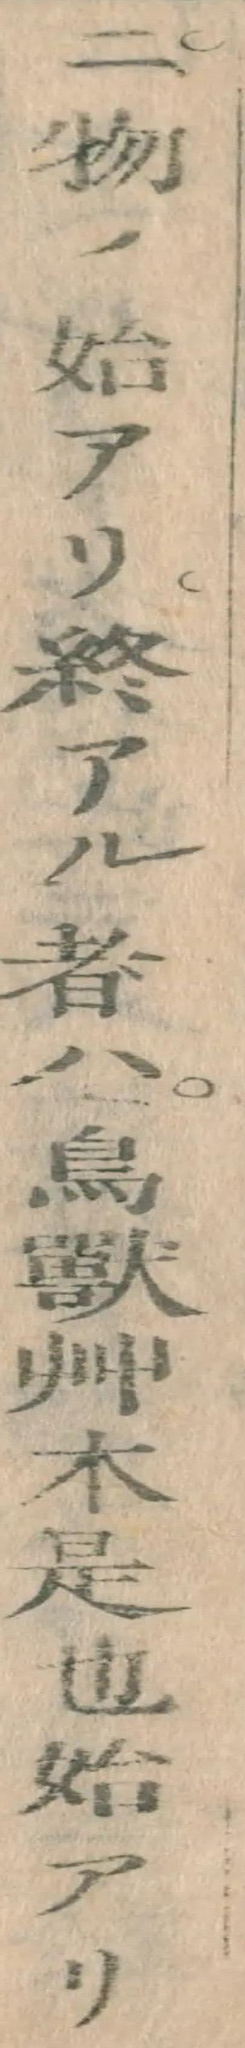ニ。物ノ始アリ。終アル者ハ。鳥獣艸木是也始アリ
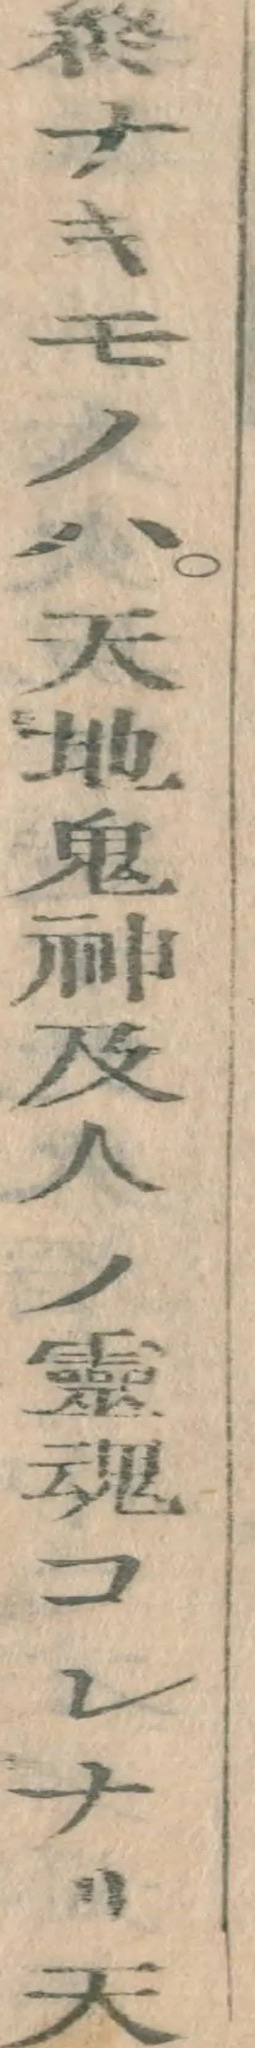終ナキモノハ。天地鬼神及人ノ霊魂コレナリ天
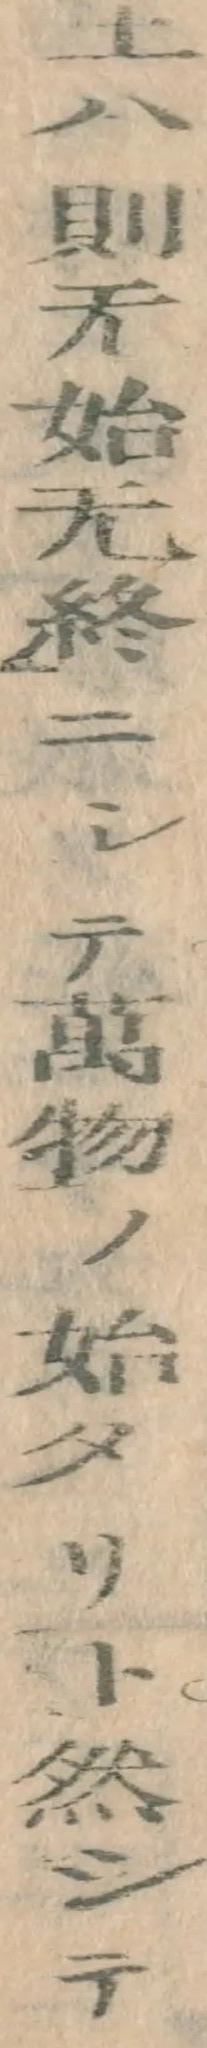主ハ則無始無終ニシテ。万物ノ始タリト。然シテ
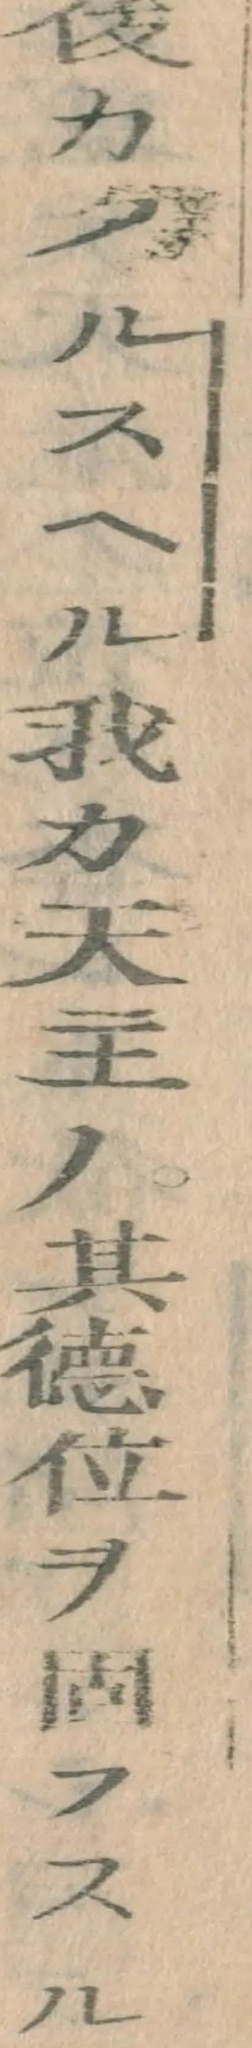後カノルスヘル我カ天主ノ。其徳位ヲ固フスル

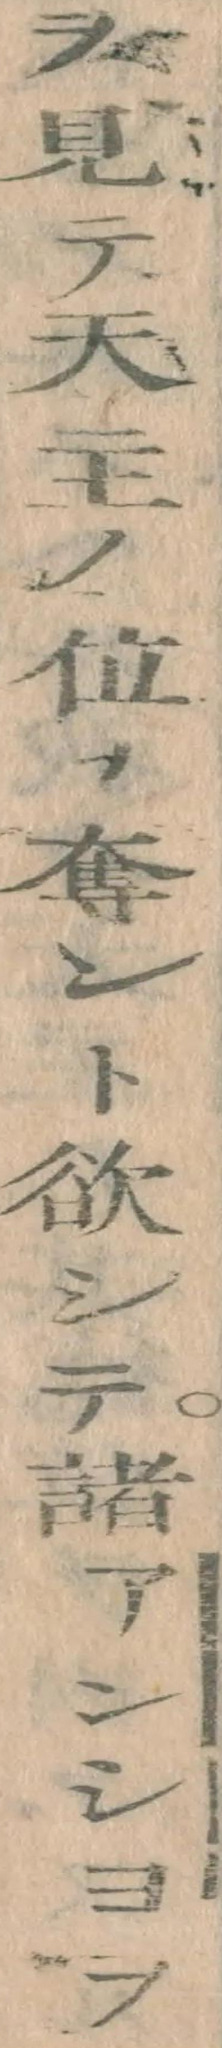ヲ見テ天主ノ位ヲ奪ント欲シテ。諸アンシヨヲ
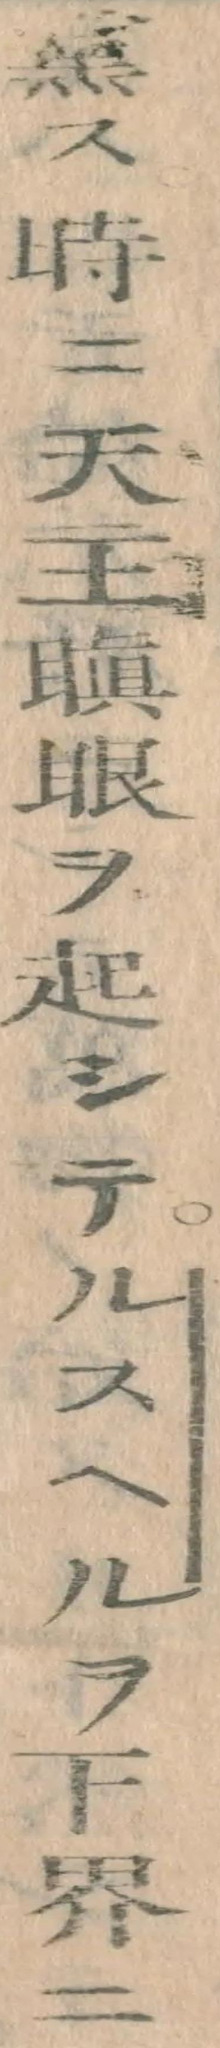党ス時ニ天主瞋眼ヲ起シテ。ルスヘルヲ下界ニ
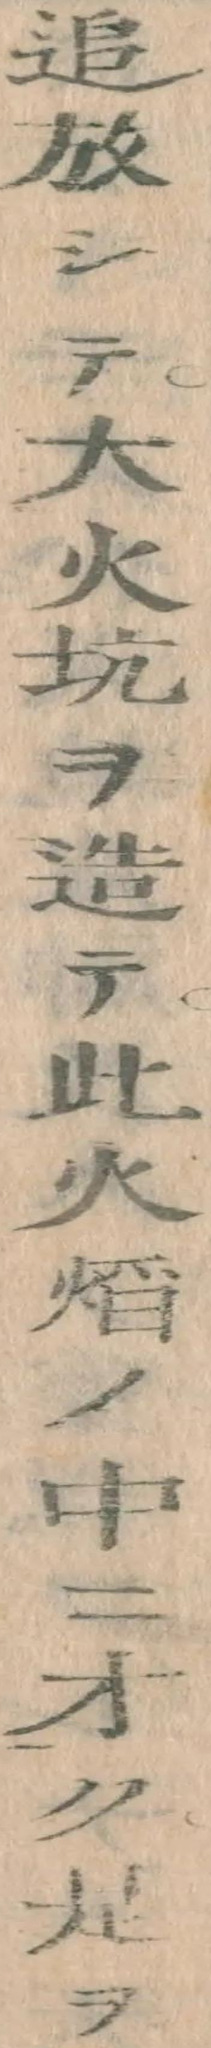追放シテ。大火坑ヲ造テ。此火焔ノ中ニオク。是ヲ
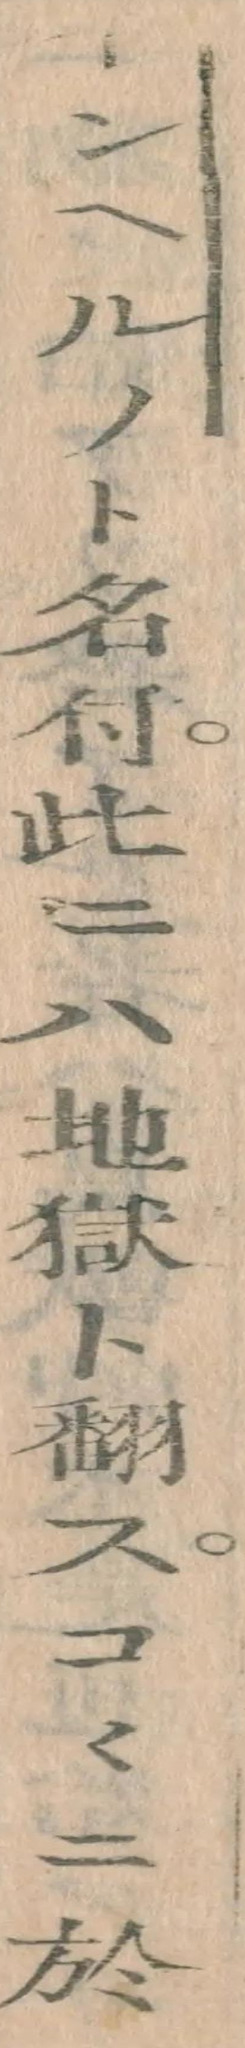インヘルノト名付。此ニハ地獄ト翻ス。コ〱ニ於
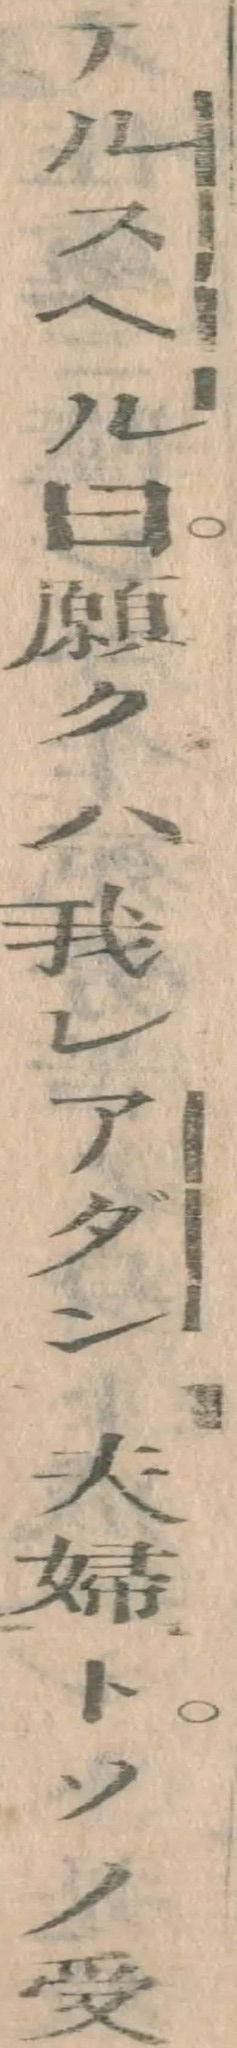テルスヘル曰。願クハ我レアダン夫婦ト。ソノ受
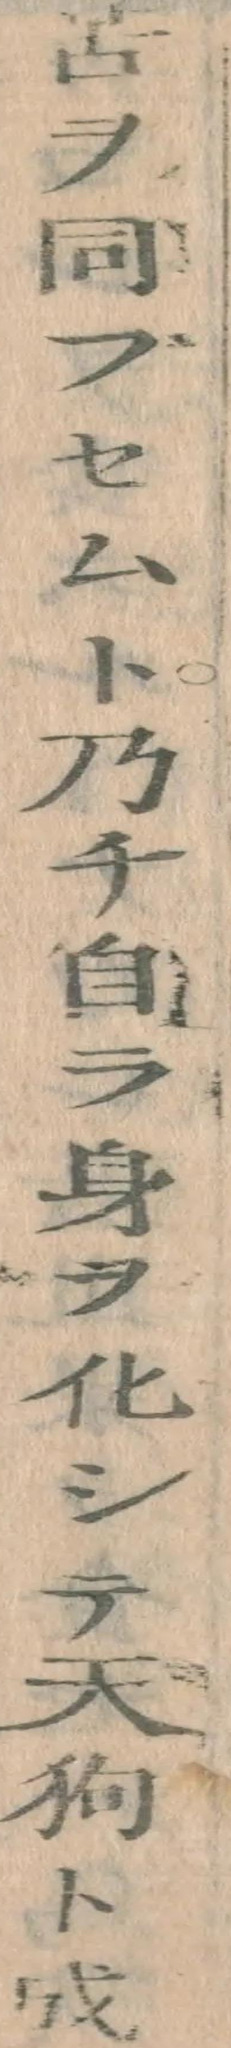苦ヲ同フセムト。乃チ自ラ身ヲ化シテ天狗ト成
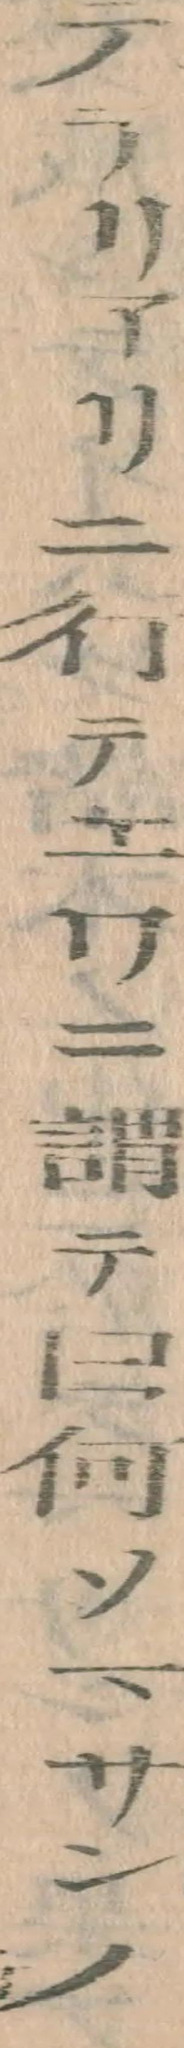テ。テリアリニ行テ。エワニ謂テ曰何ソマサンノ
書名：南蛮寺興廃記
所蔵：国立国会図書館 National Diet Library, JAPAN
